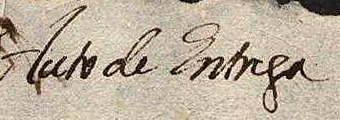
Auto de Entrega
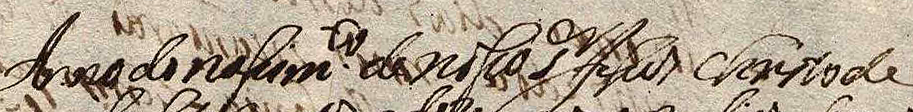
Anno do nassim.to de nosso s.or Jesus christo de
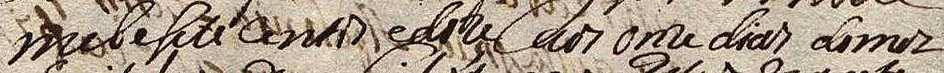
mil e setecentos e doze aos onze dias do mes
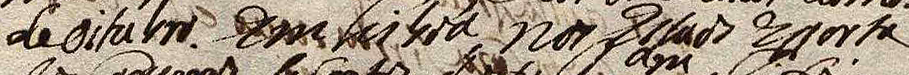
de oitubro. Em lisboa nos Estaos E porta
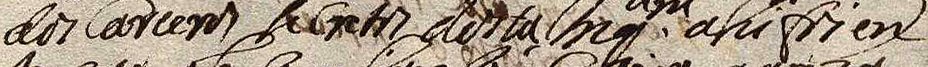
dos Carceres secretos desta Inq.am ahi foi en
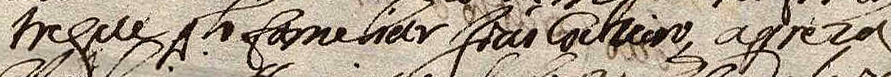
tegue p.lo fameliar João Couzeiro, a preza
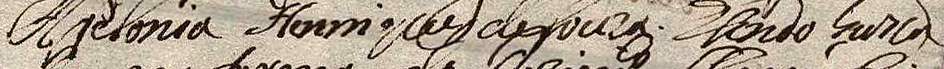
Apelonia Henrriques de souza. E sendo busca
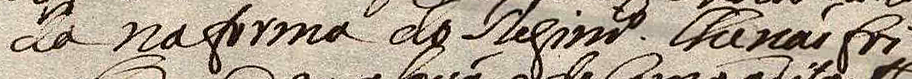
da na forma do Regim.to lhe naõ foi
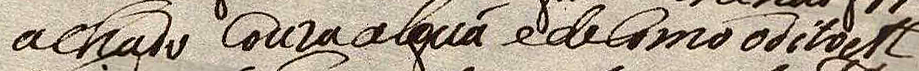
achado Couza alguā e de Como o dito Al
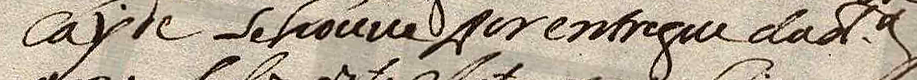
cayde se houue per entregue da d̄.a
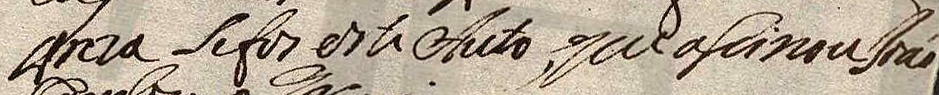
preza se fes este Auto, que assinou Ioaõ
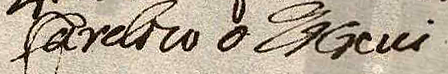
Cardozo o Escreui
